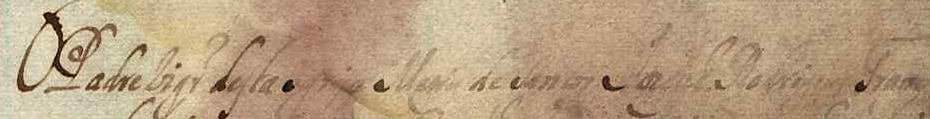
O Padre Vigr̄ desta igreja Matris de Santos Iozeph Rodrigues Fran
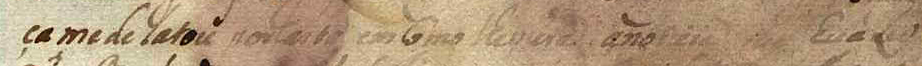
ça me delatou por carta, em Como lhe uiera a noticia _ hua Lu
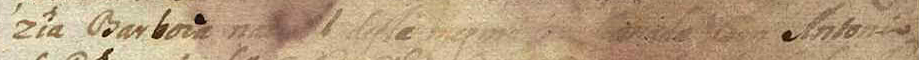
zia Barboza natural desta mesma Casada Com Antonio
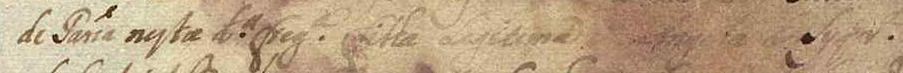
de Faria nesta d̄.a freg.a filha Legitima Angela de Syqr.a
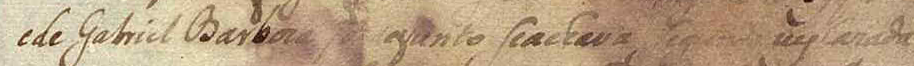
e de Gabriel Barboza, ja defunto se achava segunda ues Cazada
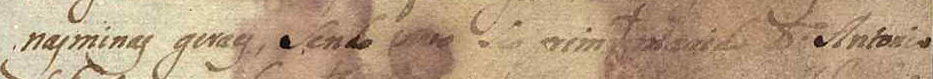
nas minas geraes, sendo vivo seo primeiro marido d̄o Antonio
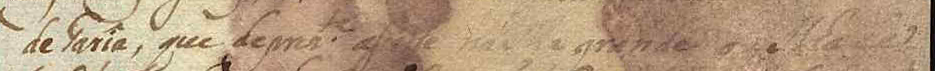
de Faria, que de prez.te assiste na Ilha grande ou Ilha de
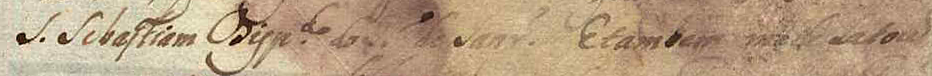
S. Sebastiam Bisp.do do R.o de Ianr.o E tambem me delatou
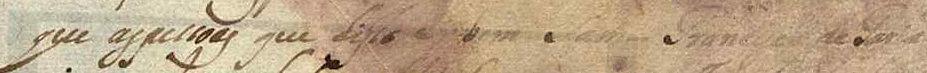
que as pessoas que disto sabem sam Francisca de Faria
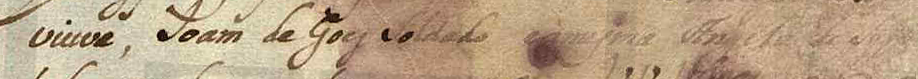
viuva, Ioam de Goes soldado e a mesma Angela de Syq
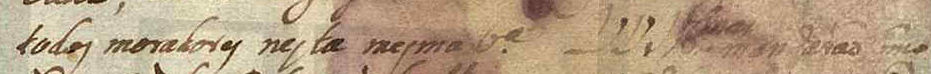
todos moradores nesta mesma v.a V.V. Ill.mas mandaraõ Como
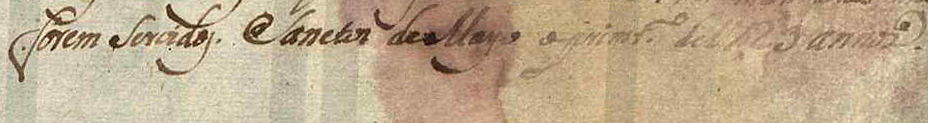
forem servidos. Sanctos de Mayo o primr.o de 1723 annoz.
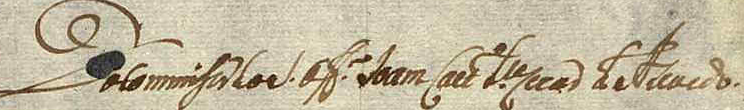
Do Commissr do S. Off.o Ioam Caet.o L.te Cezar de Azeuedo.
